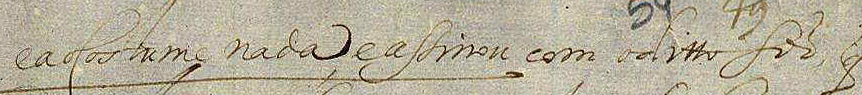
e ao Costume nada, e assinou com o ditto sor̄, q̄
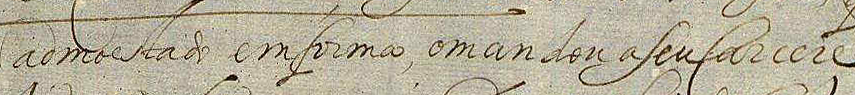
admoestado em forma, o mandou a seu Carcere
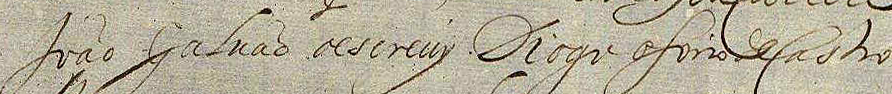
João GaLuão o escreuy. Diogo osorio de Castro
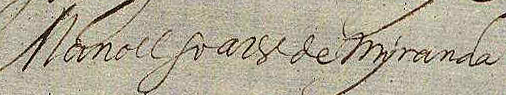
Manoel soares de myranda
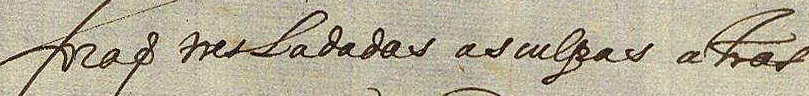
Foraõ tresLadadas as culpas atras
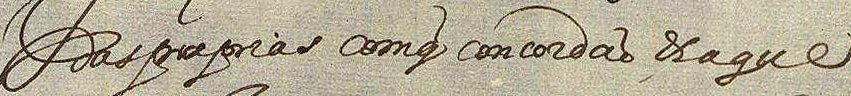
das proprias com q̄ concordaõ & a que
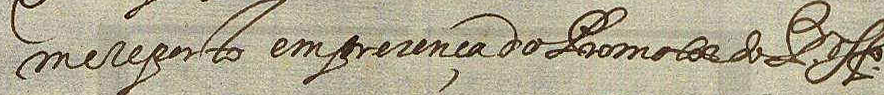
me reporto em prezença do Promotor do Sto. offo.
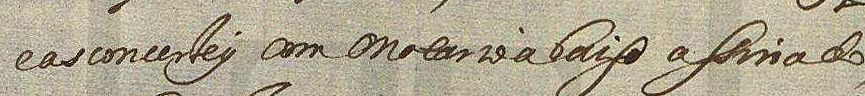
e as concertey com o notario abaixo assinado,
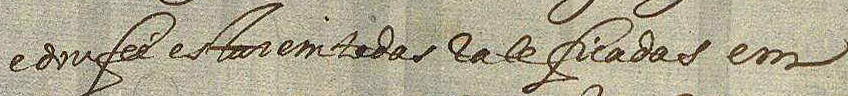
e dou feé estarem todas rateficadas em
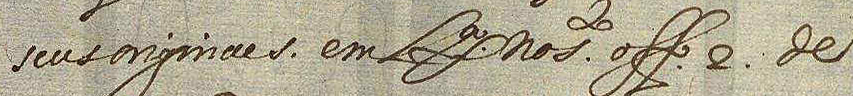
seus originaes. em Lxa. no s.to offo. 2 de
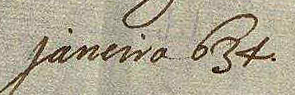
janeiro 634.
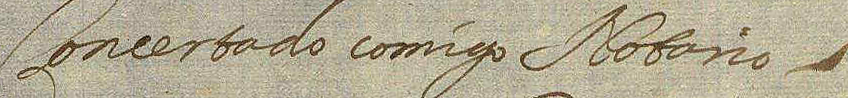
Concertado comigo Notario
